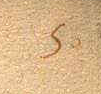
50
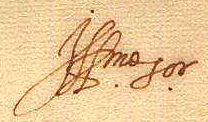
Jll.mo so.r
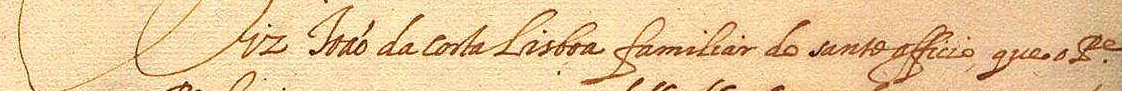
Diz Joaõ da costa Lisboa familiar do santo officio, que o P.e
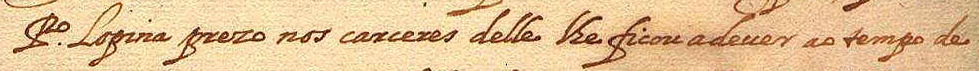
P.o Lopina prezo nos carceres delle lhe ficou a deuer ao tempo de
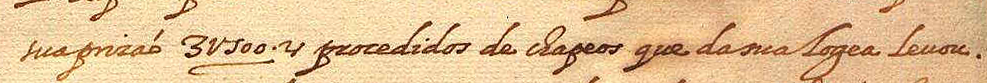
sua prizaõ 3$500. rs procedidos de chapeos que da sua Logea leuou
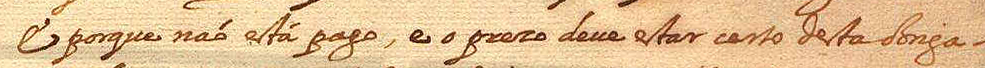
E porque naõ está pago, e o prezo deue estar certo desta obriga
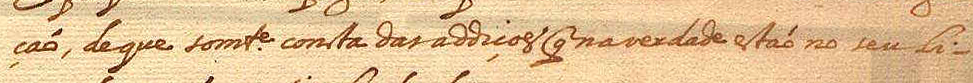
çaõ, de que somt.e consta das addiçoes q̄ na verdade estaõ no seu Li
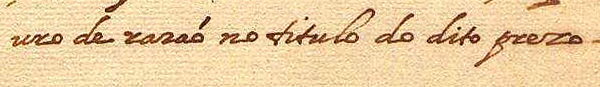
uro de razaõ no titulo do dito prezo
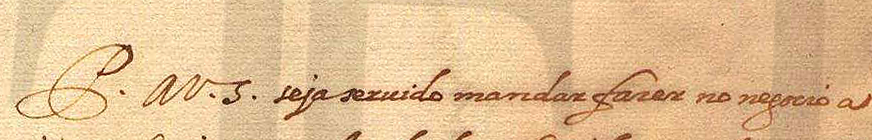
P. a v. s. seja seruido mandar fazer no negocio a
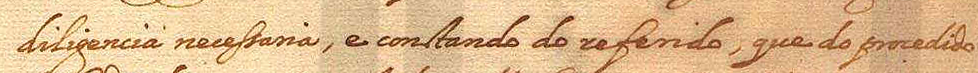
diligencia necessaria, e constando do referido, que do procedido
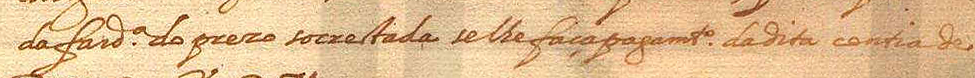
da fazd.a do prezo socrestada se lhe faça pagamto. da dita contia de
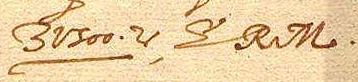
3$500. rs̄, E R M.
